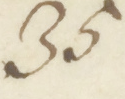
35
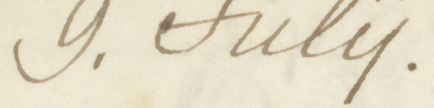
9. Julij.
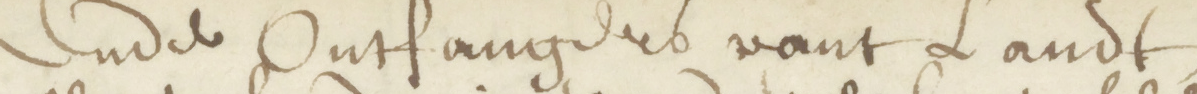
Ende Ontfangers vant Landt,
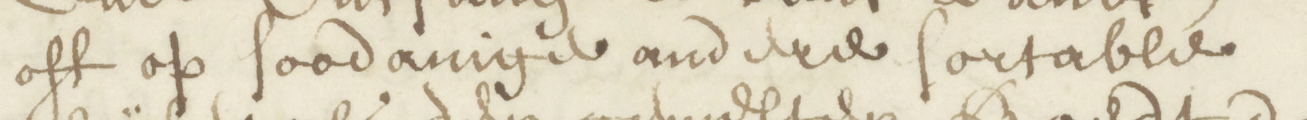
off op soodanige andere sortable
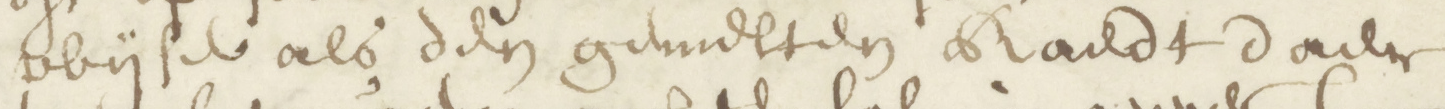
wijse als den gemelten Raedt daer
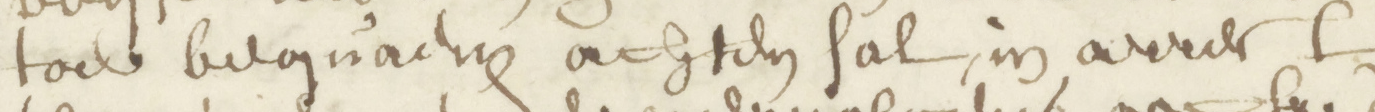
toe bequam achten sal, in arrest
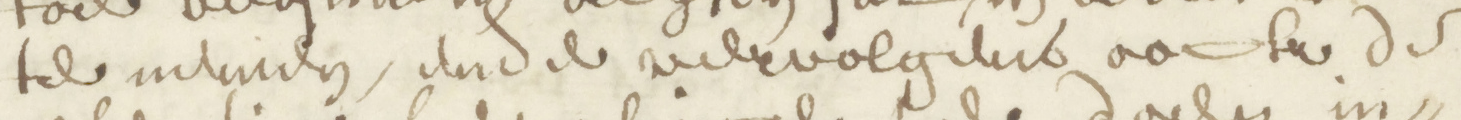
te nemen, ende vervolgens oock de
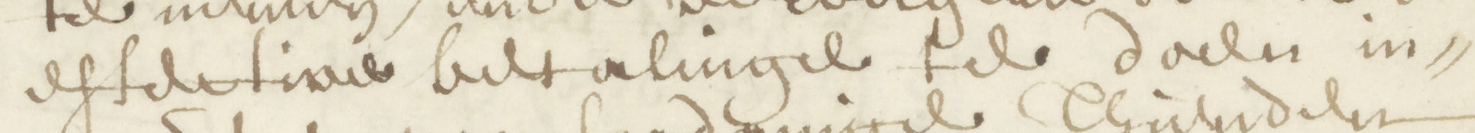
effective betalinge te doen in„
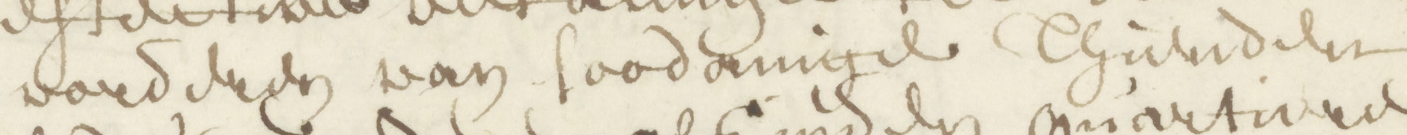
vorderen van soodanige Thienden
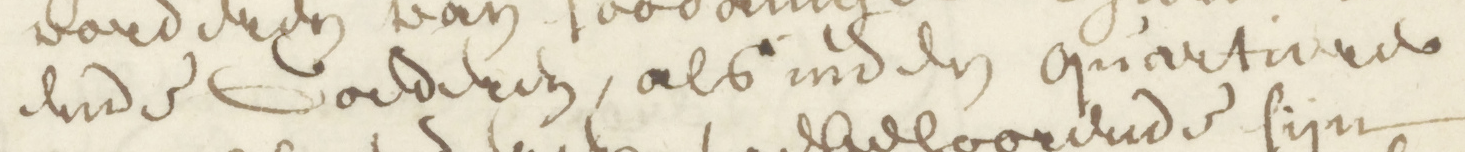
ende Goederen als inden quartiere
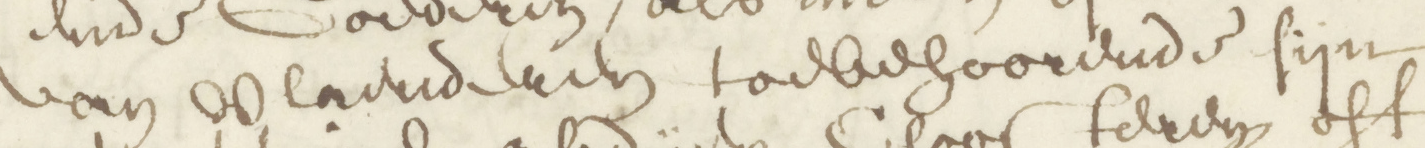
van Vlaenderen toebehoorende sijn
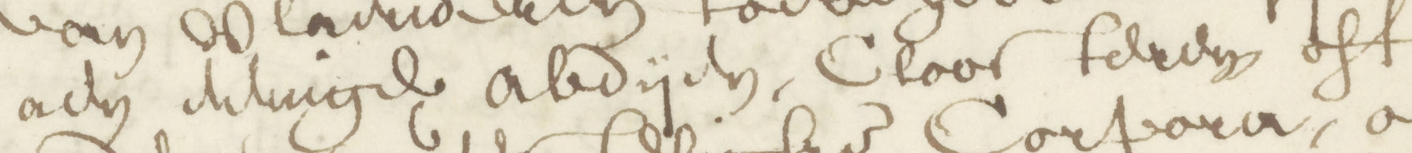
aen eenige abdijen, Cloosteren off
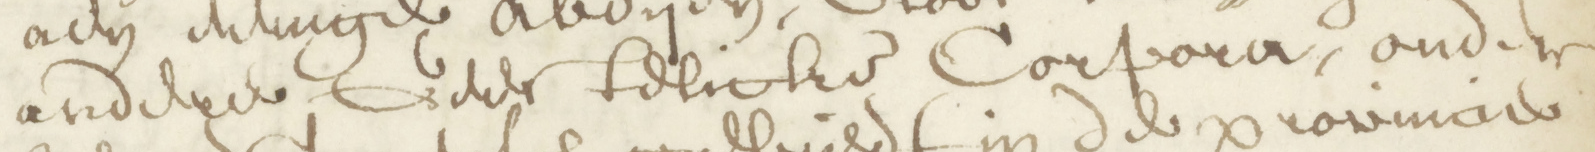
andere Geestelicke Corpora, onder
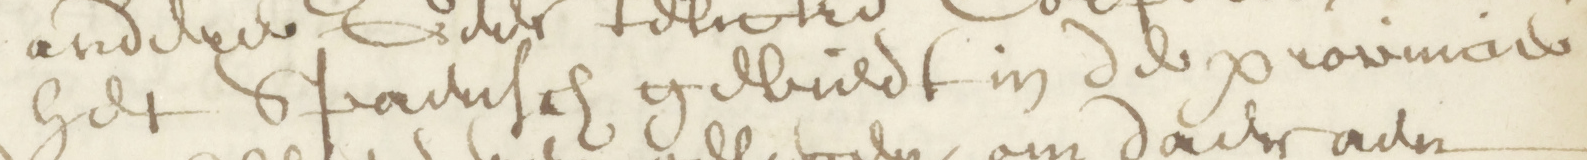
het Spaensch gebiedt in de provincie
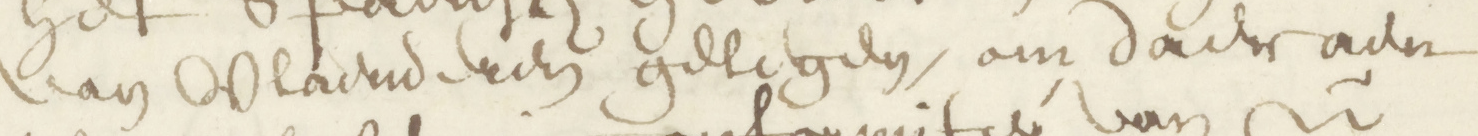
van Vlaenderen gelegen, om daeraen
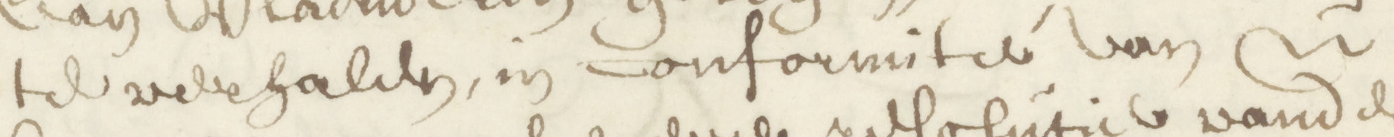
te verhalen, in conformité van U
